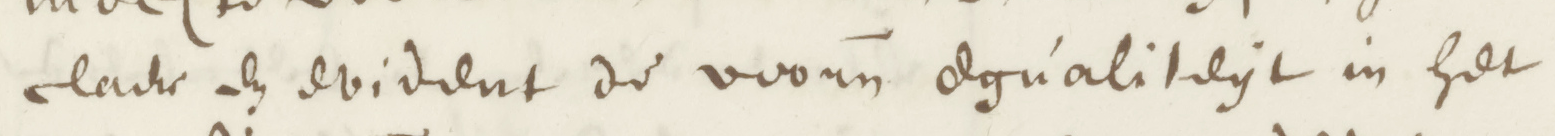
claer en evident de voorn egualiteijt in het
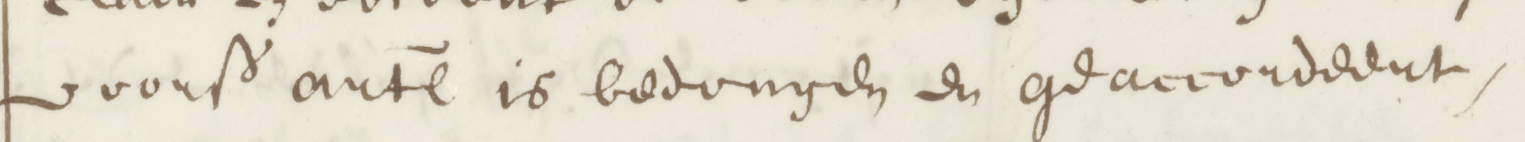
voors artl is bedongen en geaccordeert.
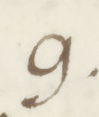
9.
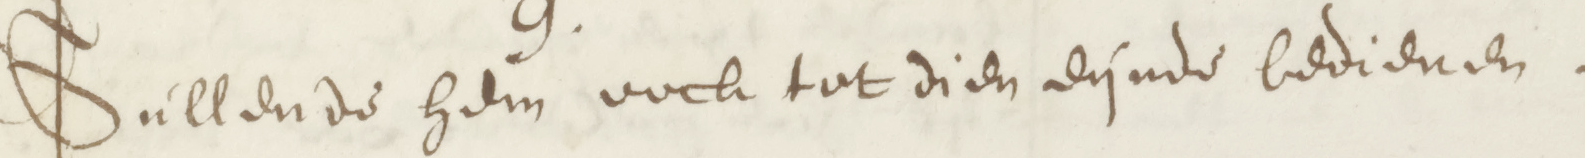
Sullende hem oock tot dien eijnde bedienen
